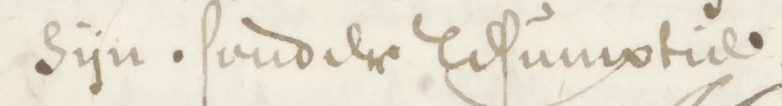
sijn, sonder resumptie.
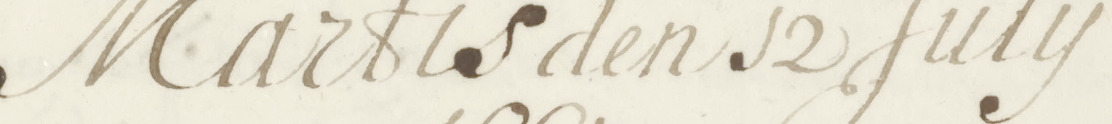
Martis den 12 Julij
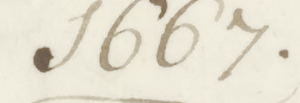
1667.
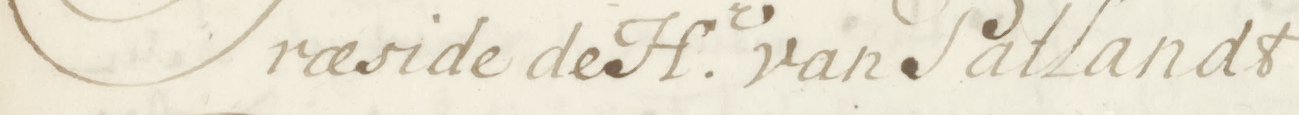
Preside de Heer van Pallandt
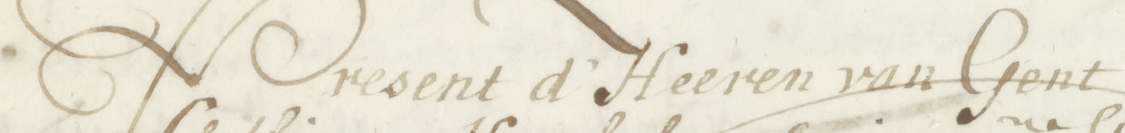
Present d'Heeren van Gent,
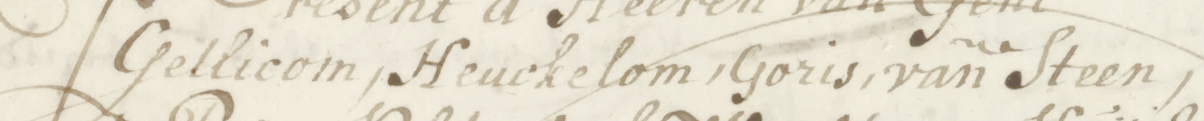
Gellicom, Heuckelom, Goris, van Steen,
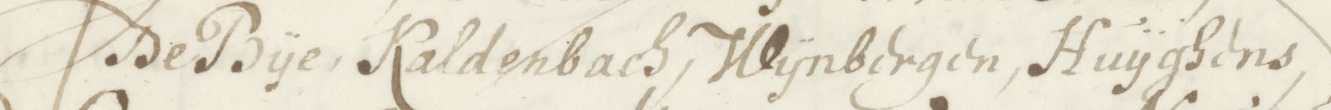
De Bije, Kaldenbach, Wijnbergen, Huijghens,
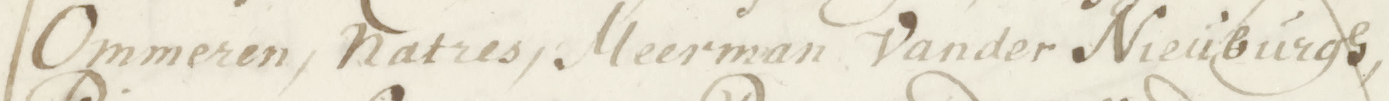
Ommeren, Natres, Heerman, Van der Nieuburgh,
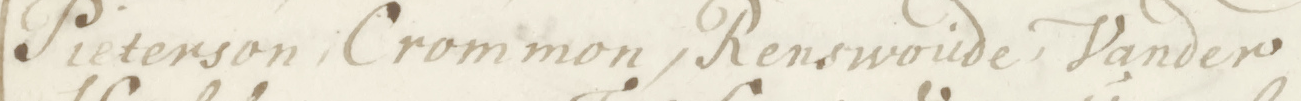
Pietersen, Crommon, Renswoude, Vander
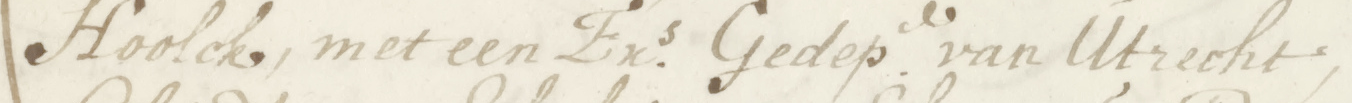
Hoolck, met een Exs. Gedep.e van Utrecht
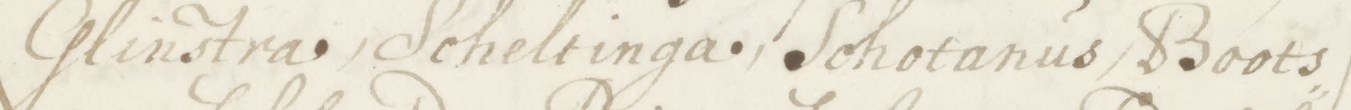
Glinstra, Scheltinga, Schotanus, Boots„
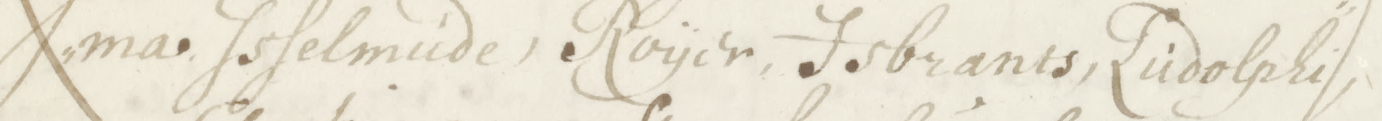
ma Isselmude, Roijer, Isbrants, Ludolphi,
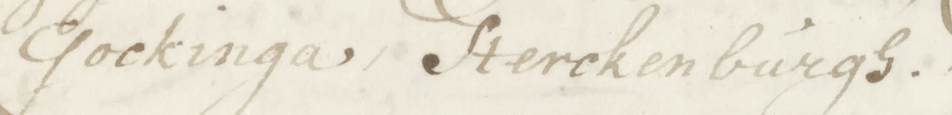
Gockinga, Sterckenburgh.
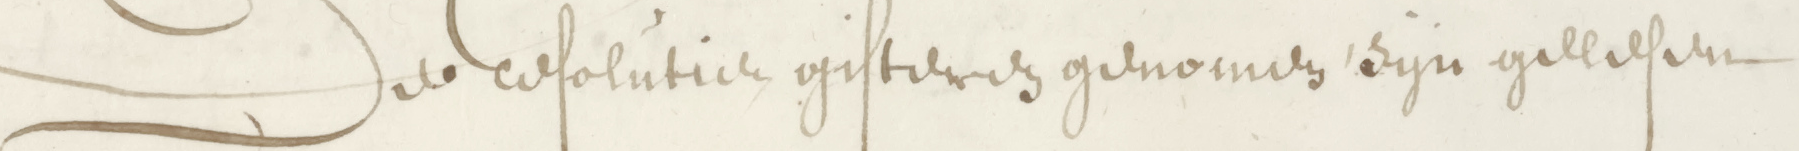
De resolutien gisteren genomen sijn gelesen
